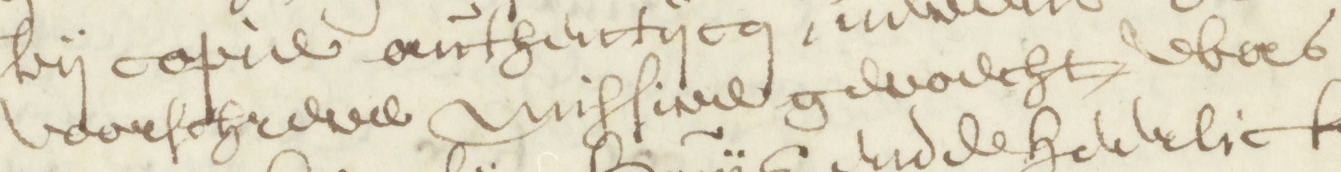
voorschreve missive gevoecht, was
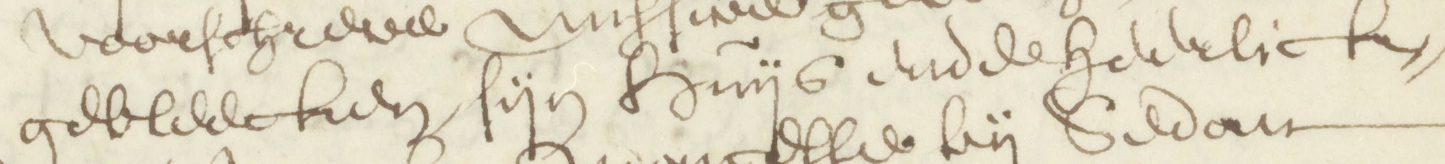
gebleecken, sijn Huijs ende heerlick„
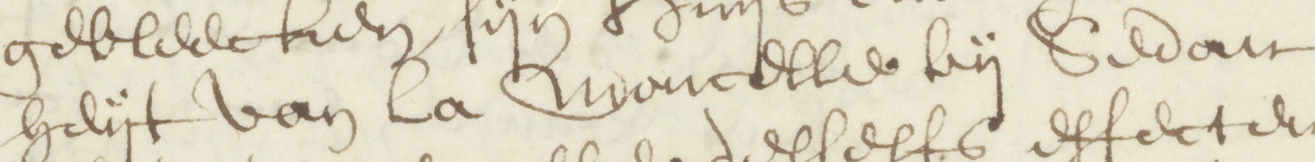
heijt van la Moncelle bij Sedan
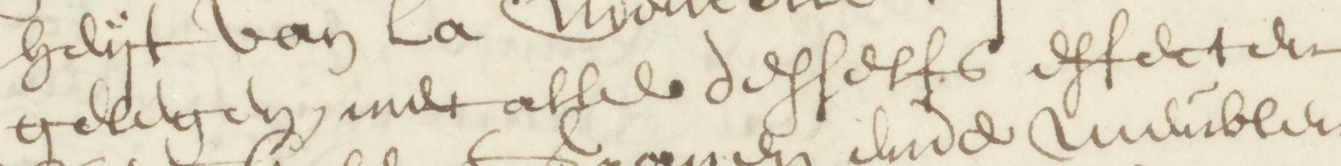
gelegen, met alle desselfs effecten
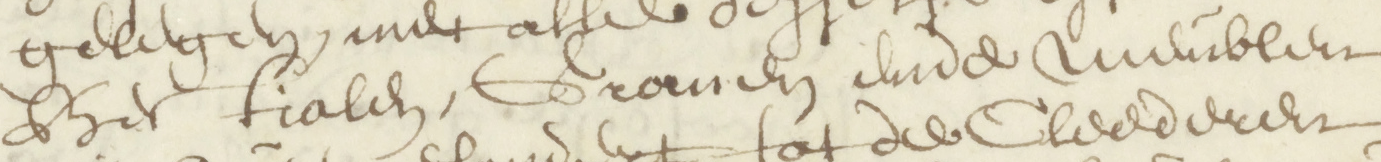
Bestialen, Granen ende Meublen
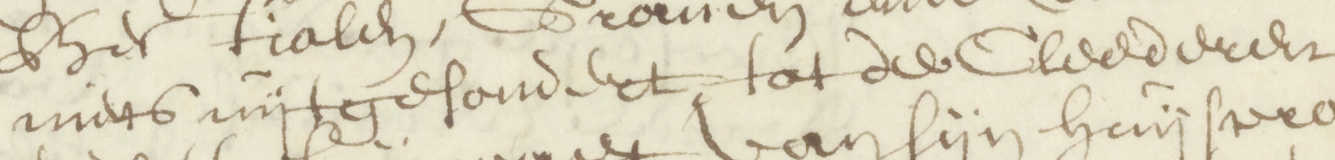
niets uijtgesondert, tot de Cleederen
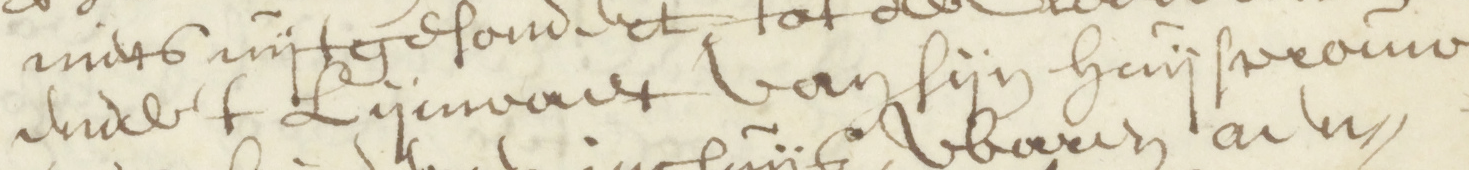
ende 't Lijnwaet van sijn huijsvrouw
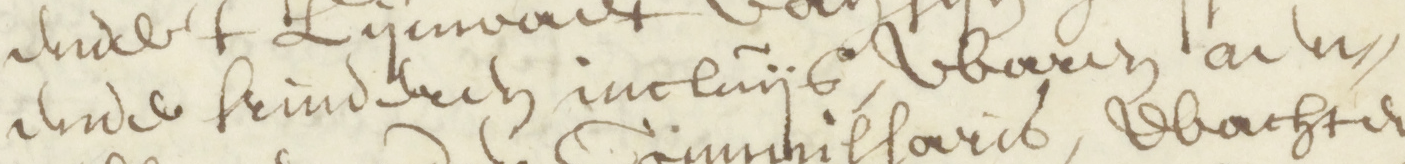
ende kinderen incluijs, waren aen„
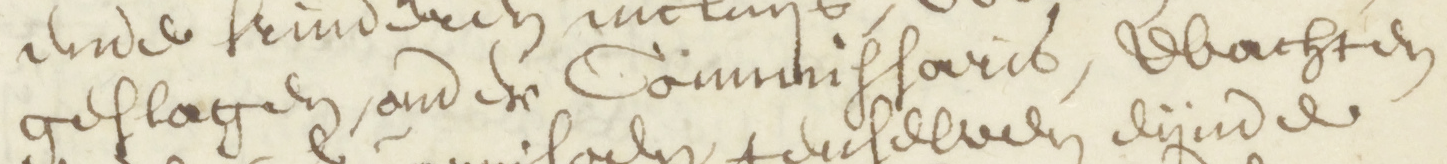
geslagen, onder Commissaris, Wachten
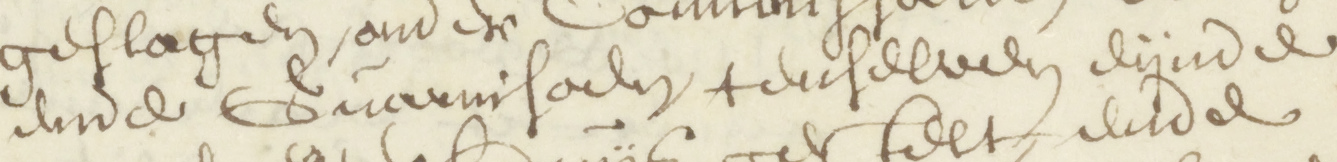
ende Guarnisoen, tenselven eijnde
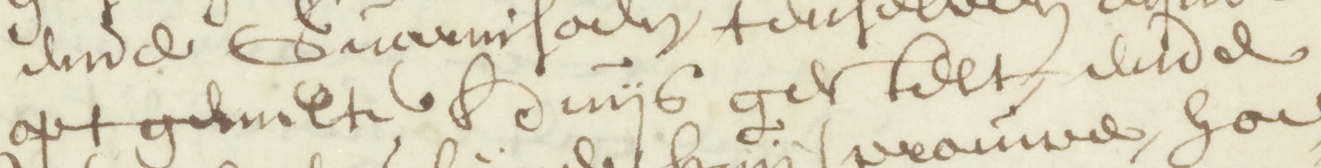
opt gemelte Huijs gestelt, ende
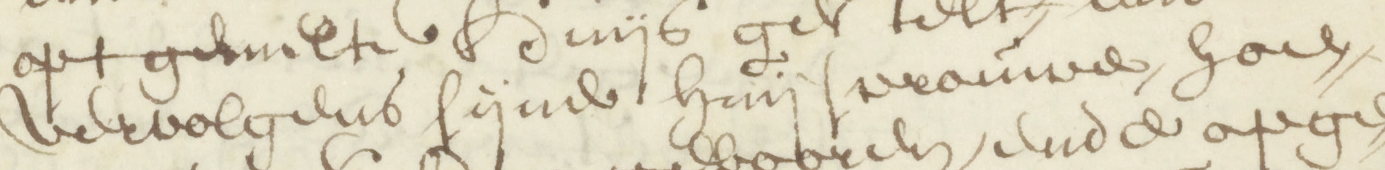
vervolgens sijne huijsvrouwe, hoe„
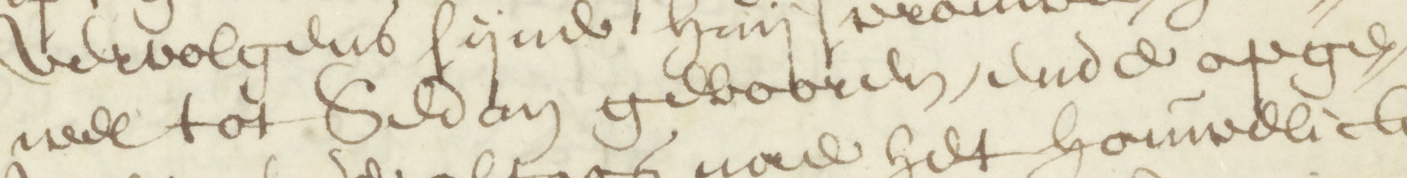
wel tot Sedan gebooren, ende opge„
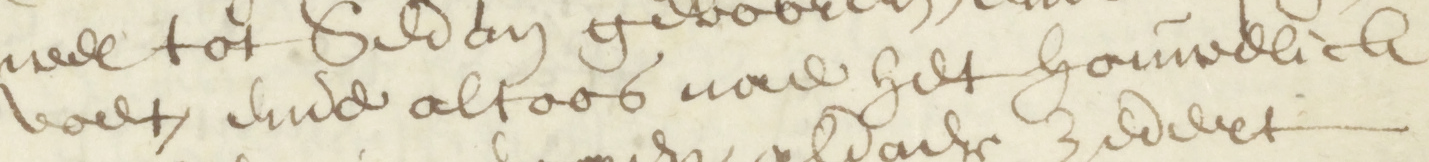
voet, ende altoos nae het houwelick
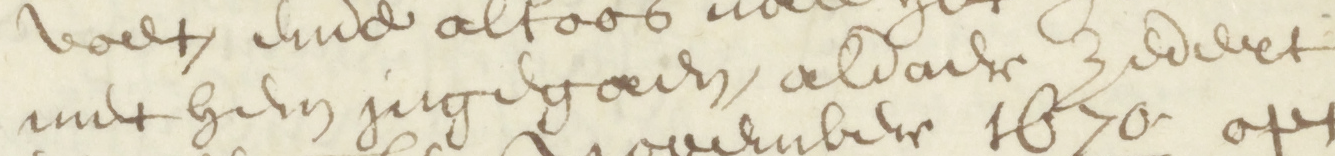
met hem ingegaen, aldaer zedert
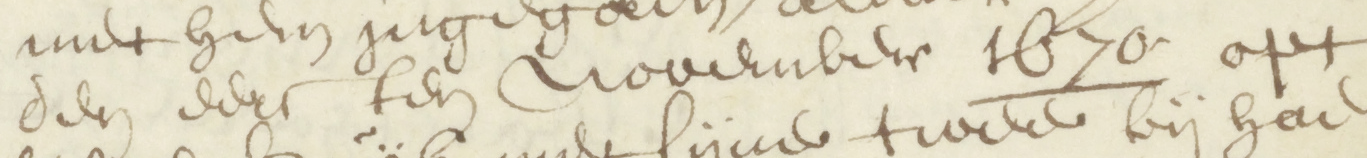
den eersten November 1670. opt
